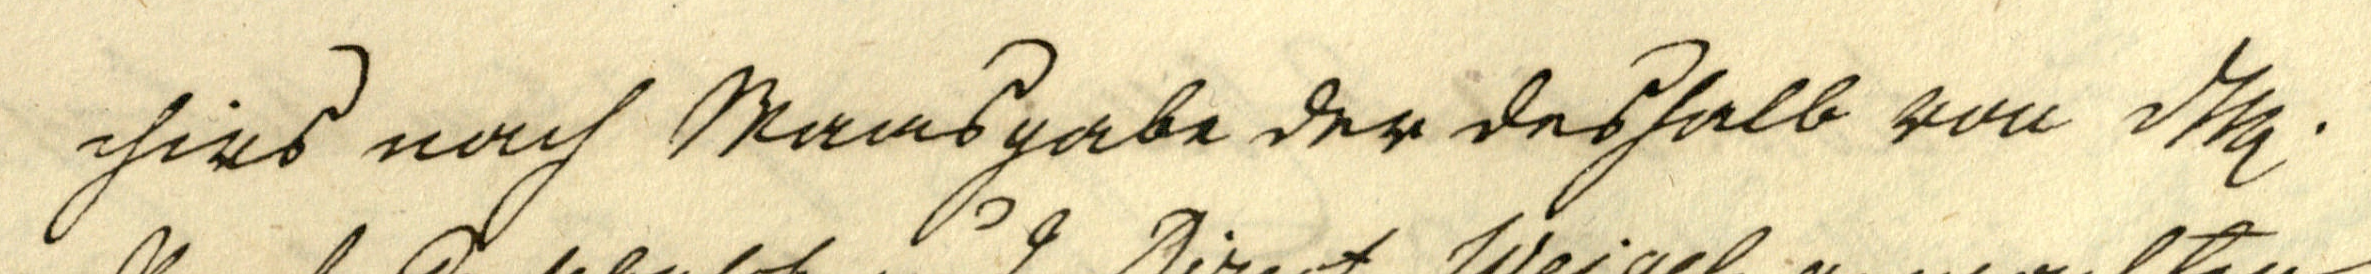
chivs nach Maasgabe der deshalb von dh.
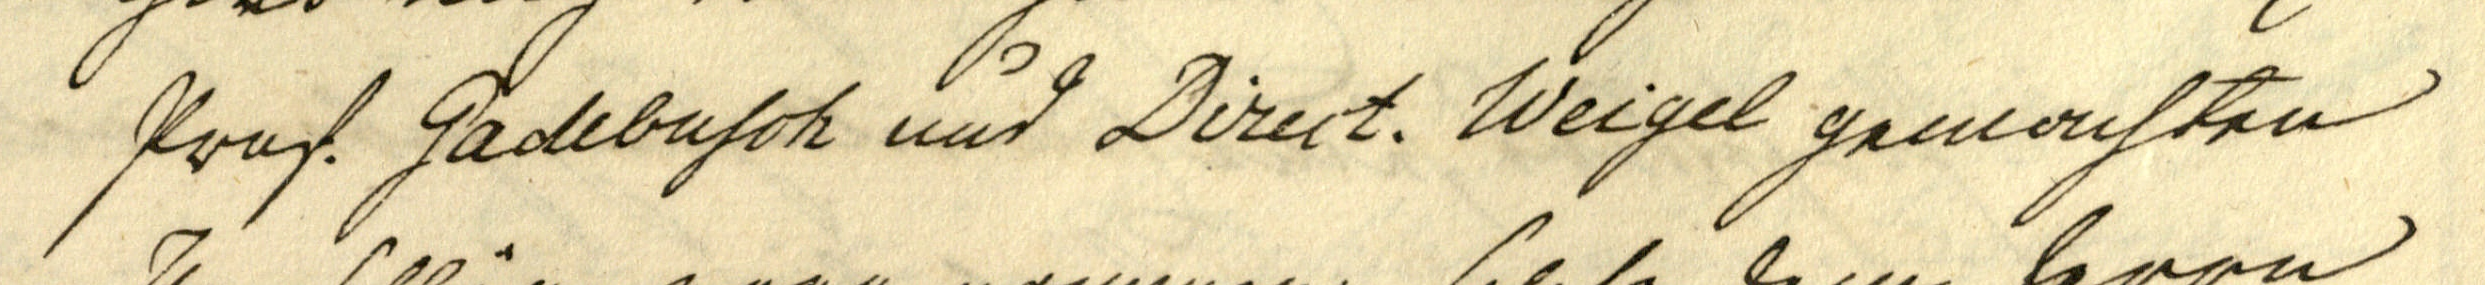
Prof. Gadebusch und Direct. Weigel gemachten
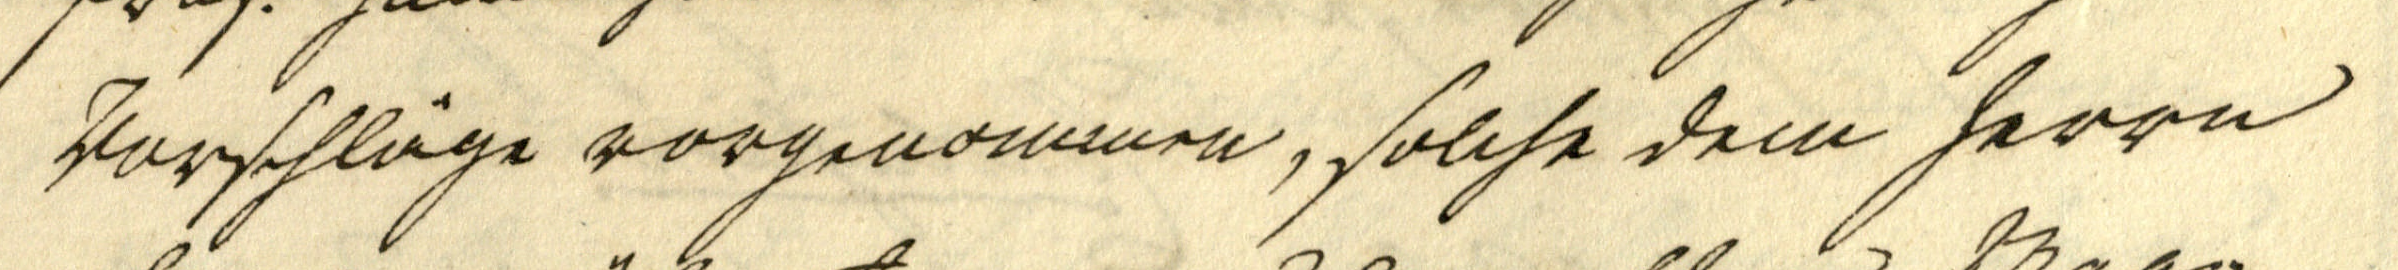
Vorschläge vorgenommen, solche dem Herrn
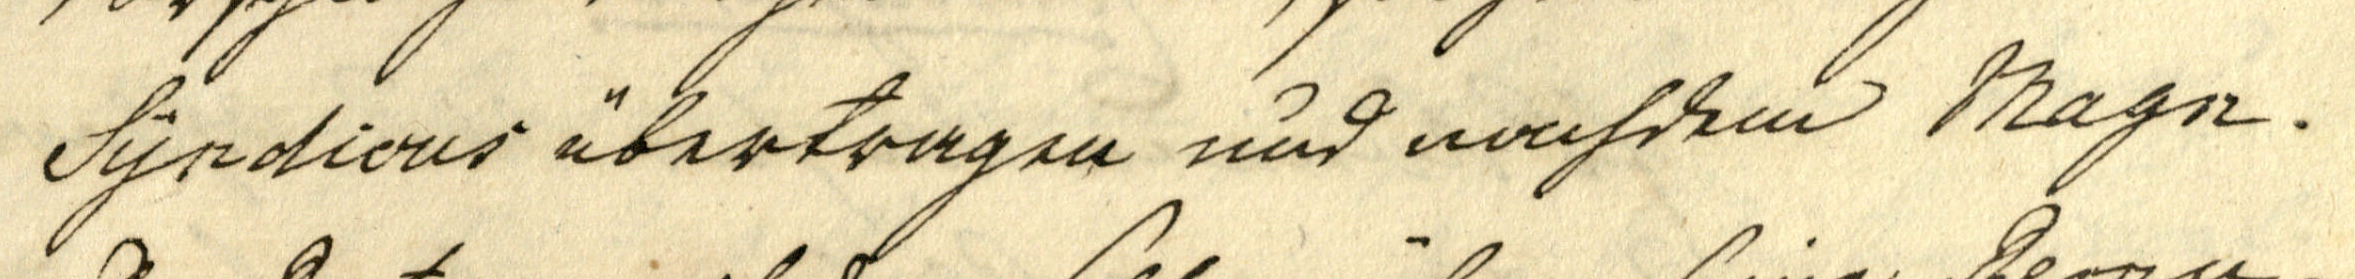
Sÿndicus übertragen und nachdem Magn.
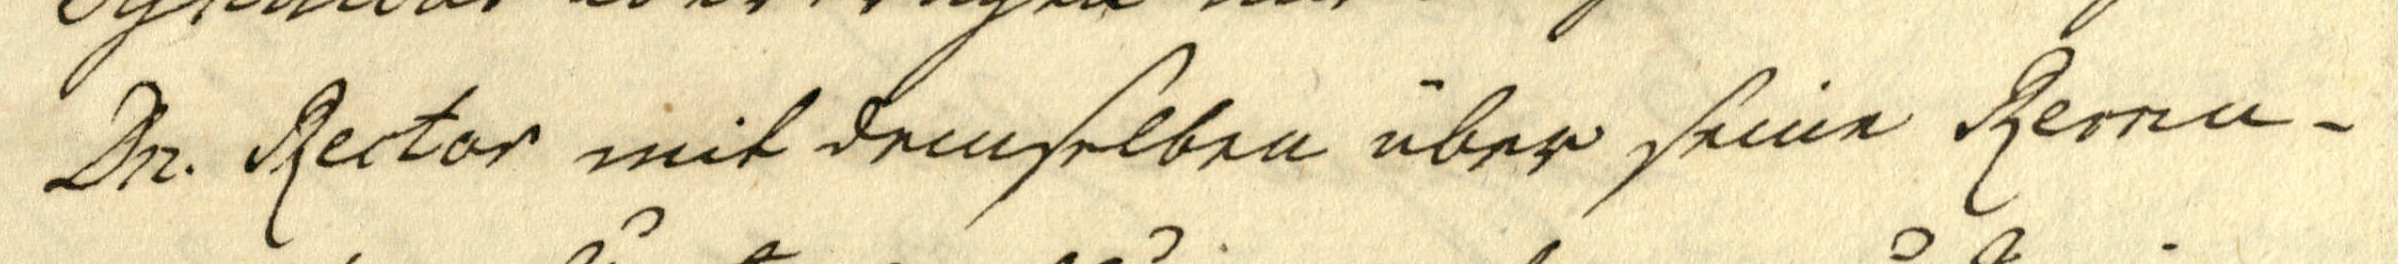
Dn. Rector mit demselben über seine Remu-
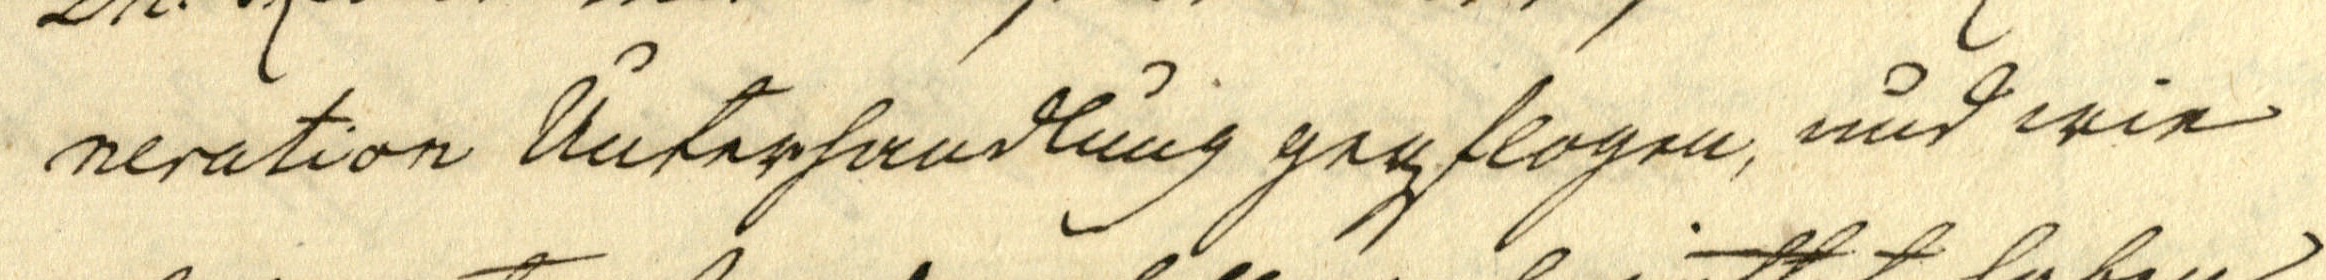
neration Unterhandlung gepflogen, und wie
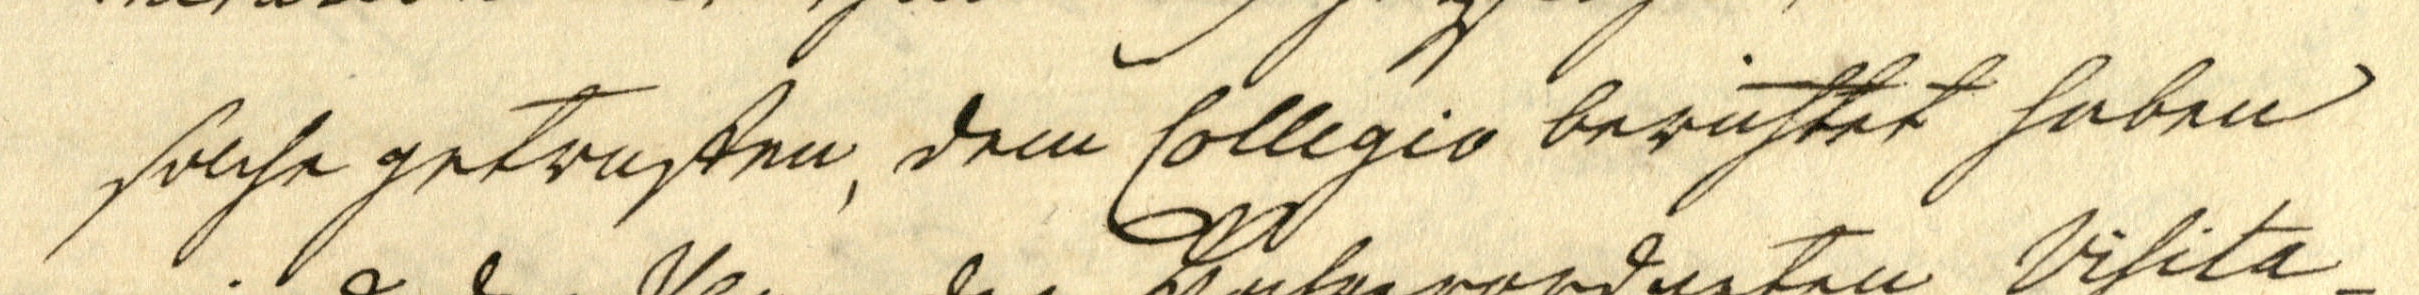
solche getroffen, dem Collegio berichtet haben
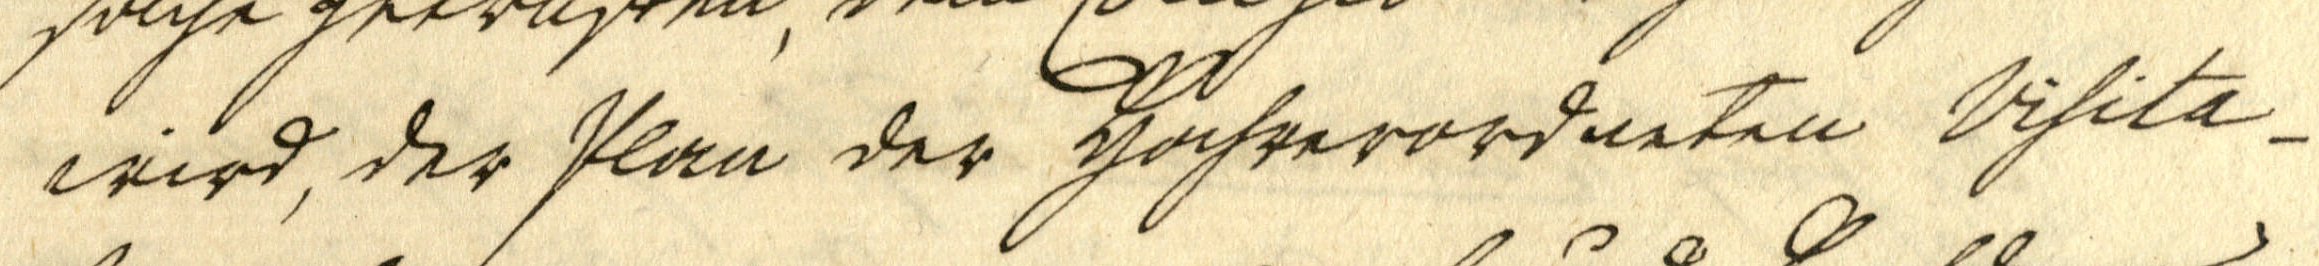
wird, der Plan der Hochverordneten Visitat¬
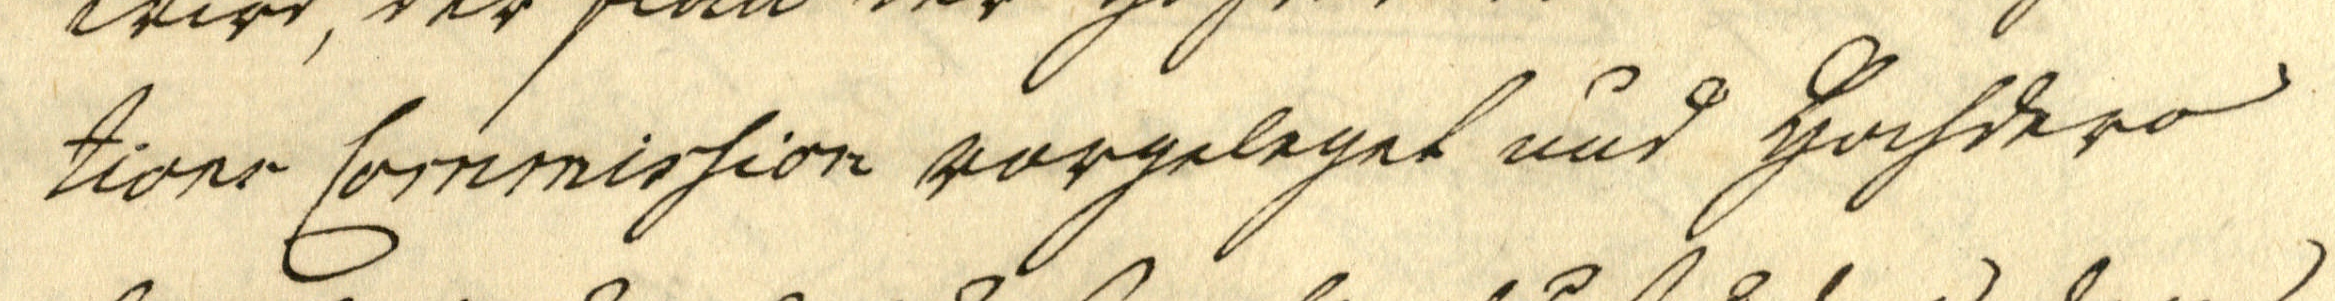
tions Commission vorgeleget und Hochdero
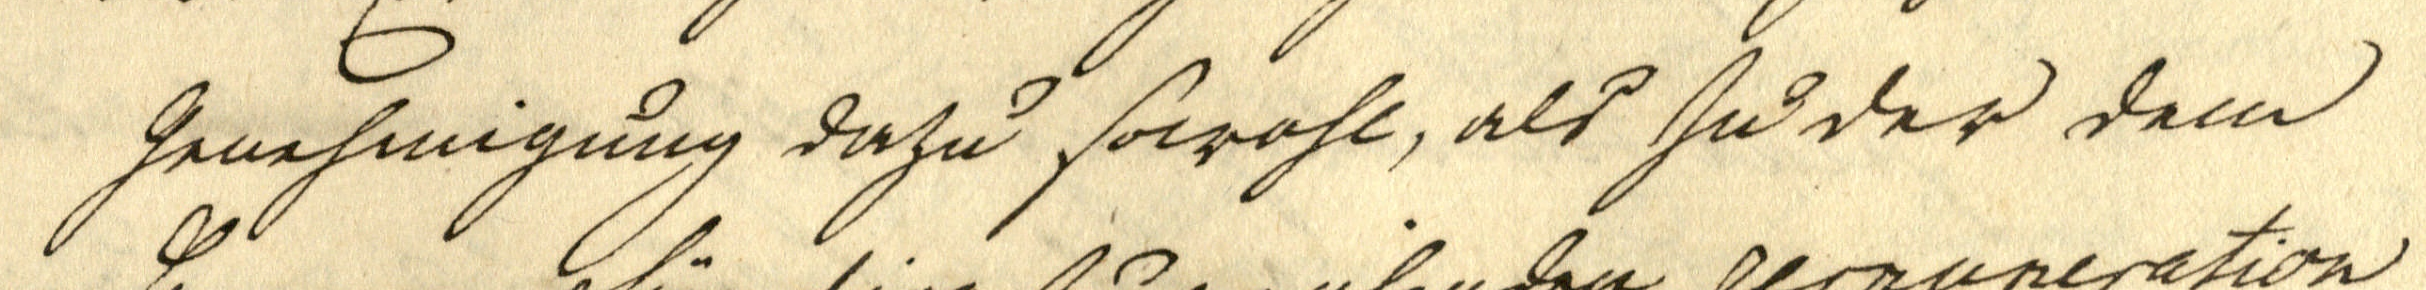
Genehmigung dazu sowohl, als zu der dem
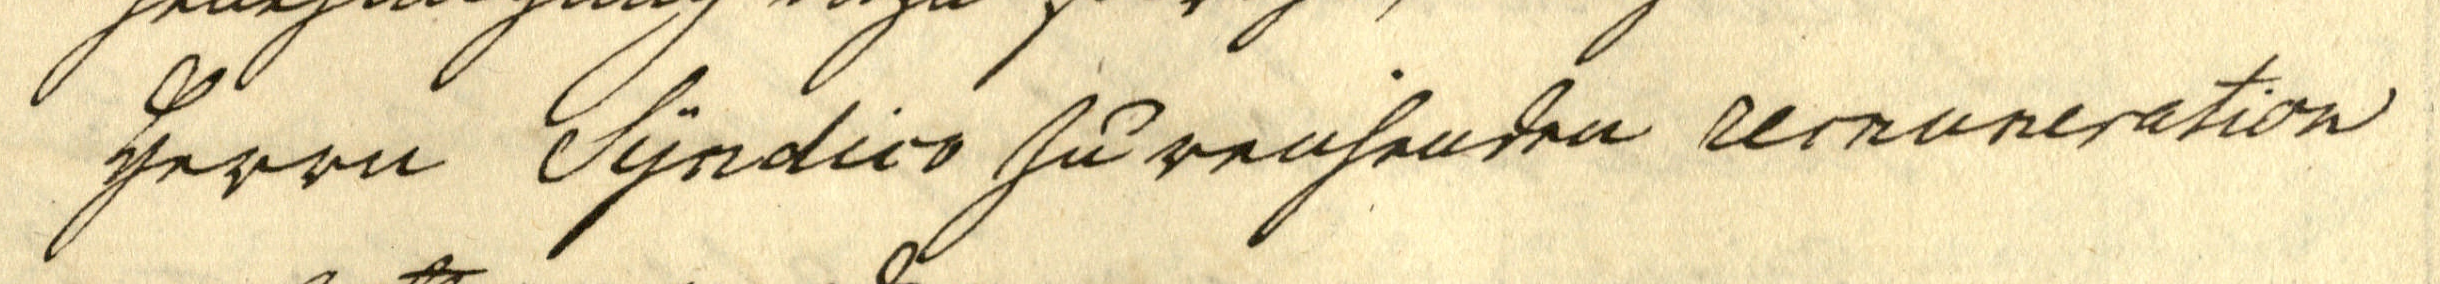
Herrn Syndico zu reichenden remuneration
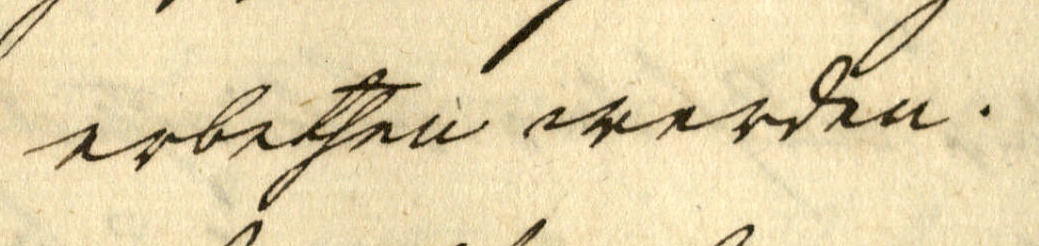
erbethen werden.
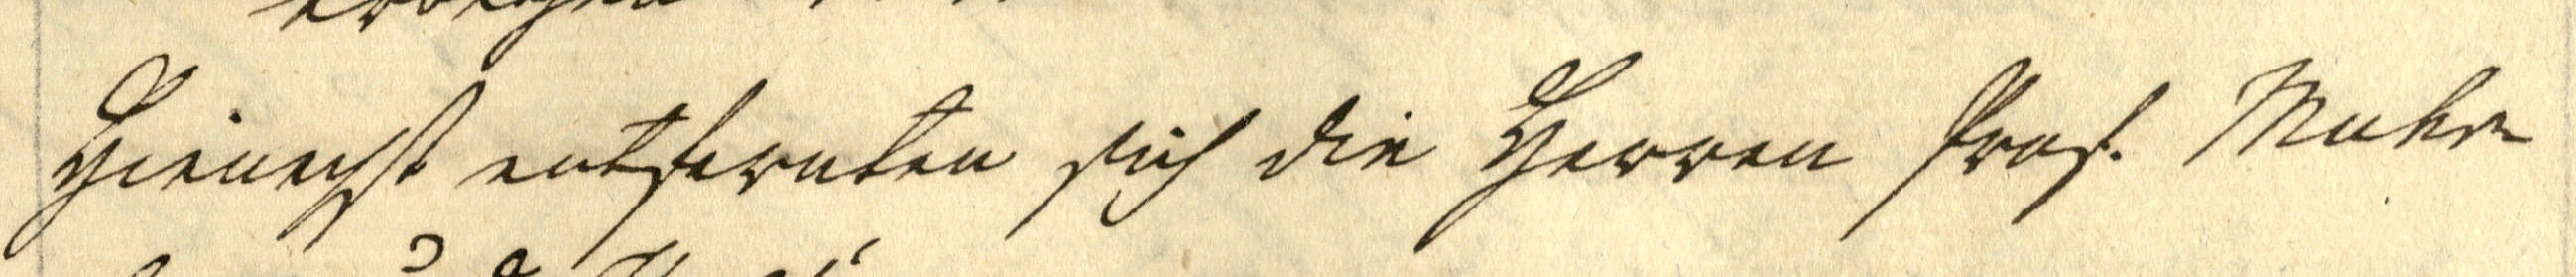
Hienechst entfernten sich die Herren Prof. Muhr¬
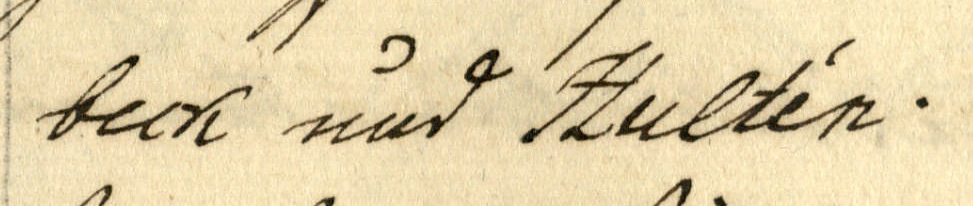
beck und Hultén.
